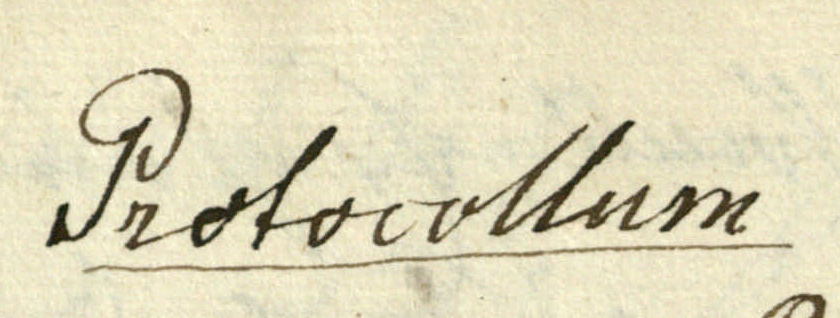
Protocollum
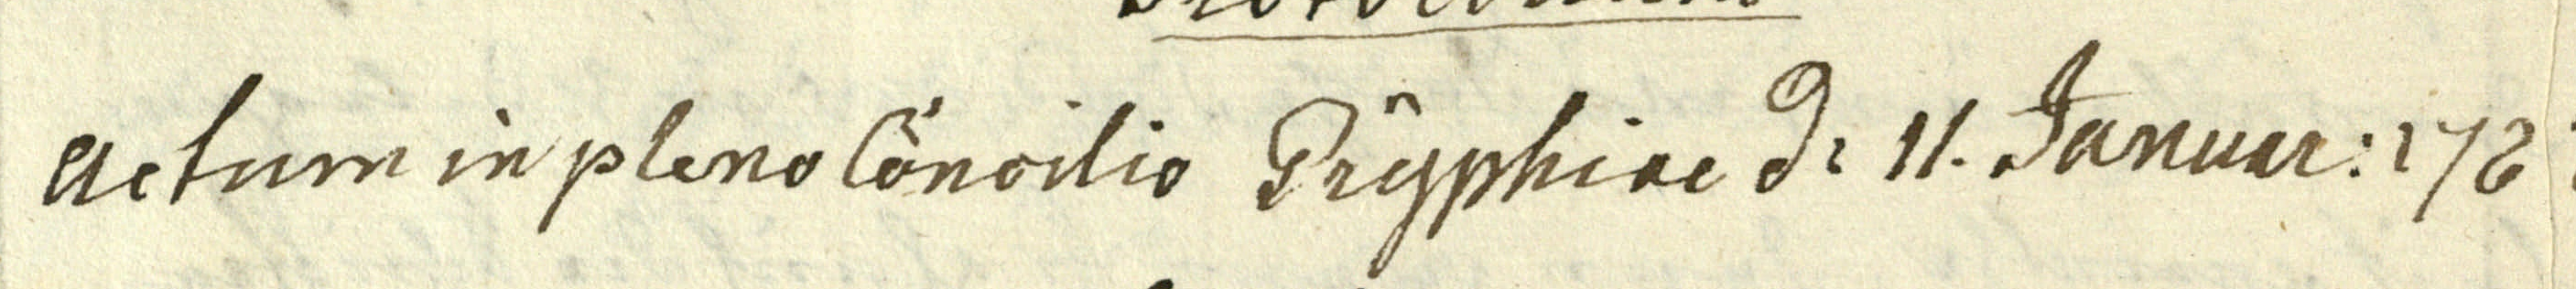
Actum in pleno Concilio Grÿphiae d. 11. Januar 1787
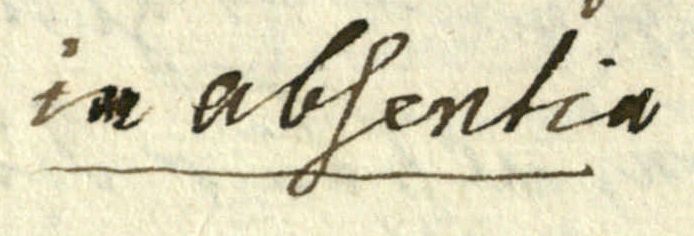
in absentia
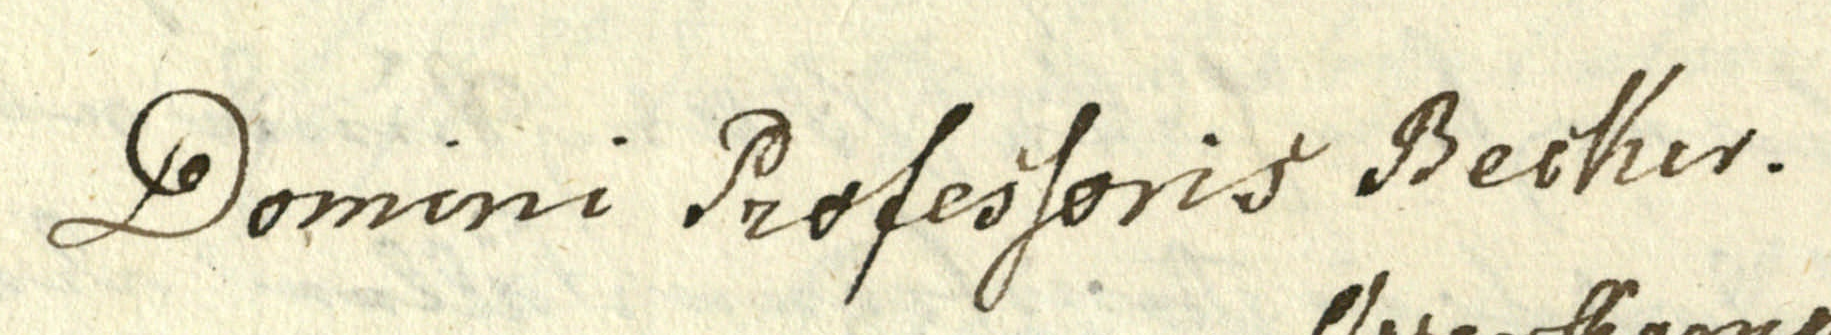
Domini Professoris Becker.
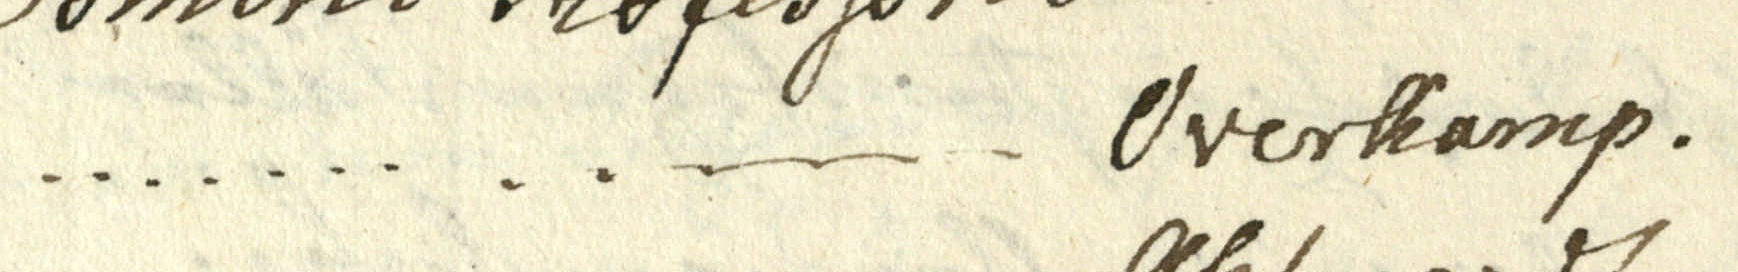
Overkamp.
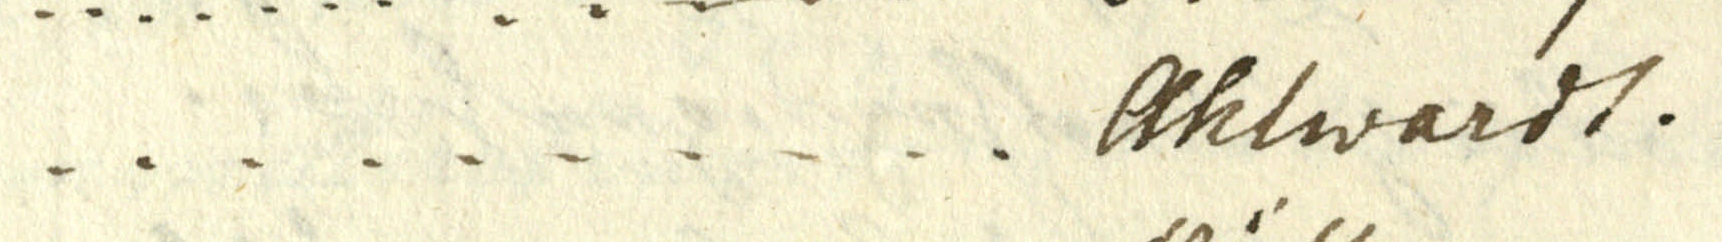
Ahlwardt.
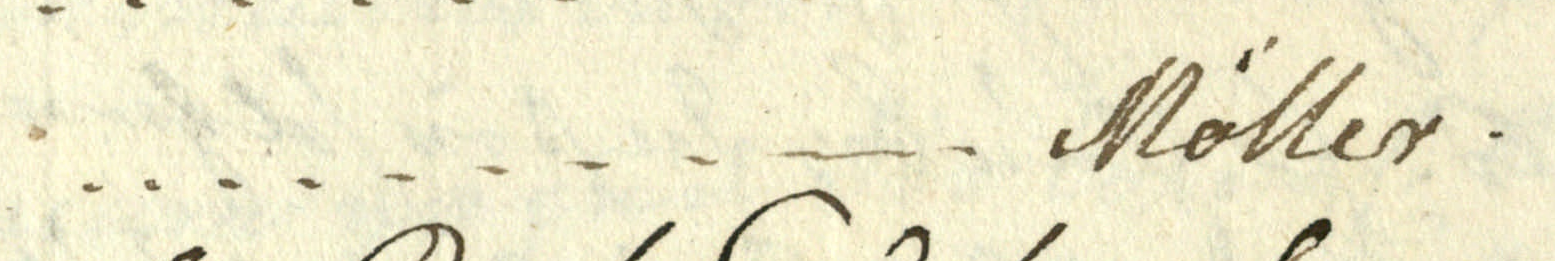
Möller.
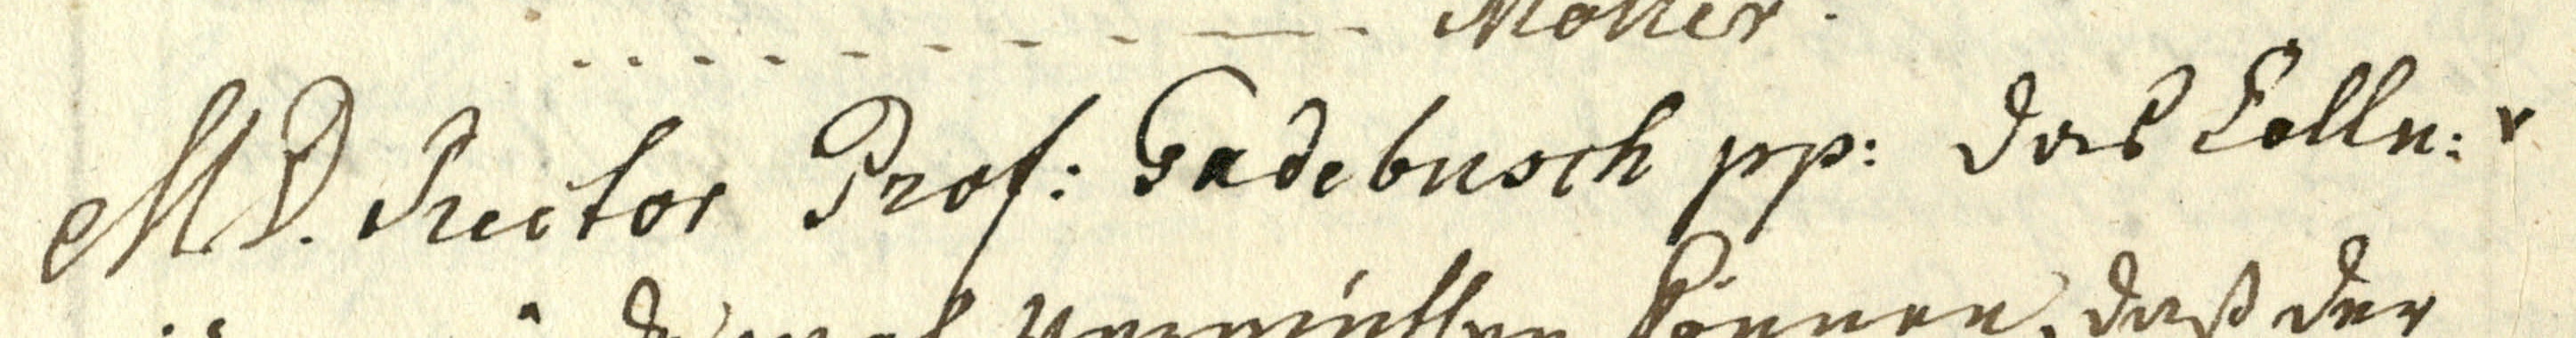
M. D. Rector Prof. Gadebusch pp. Das Colle¬
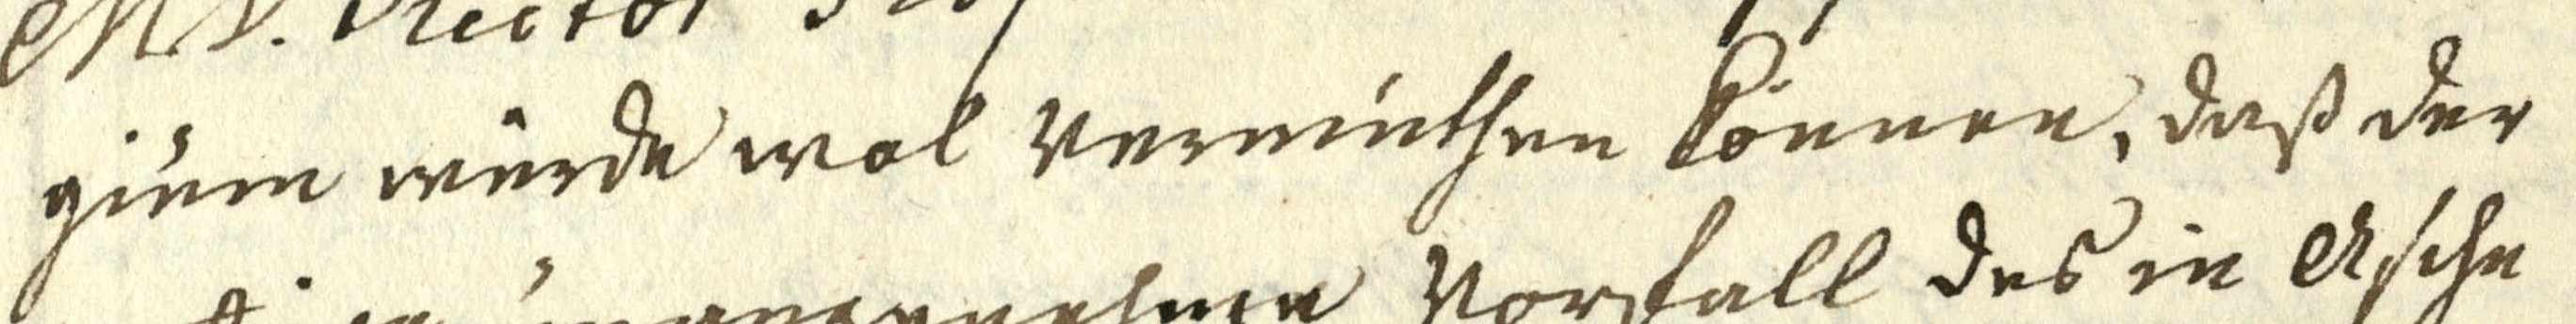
gium würde wol vermuthen können, daß der
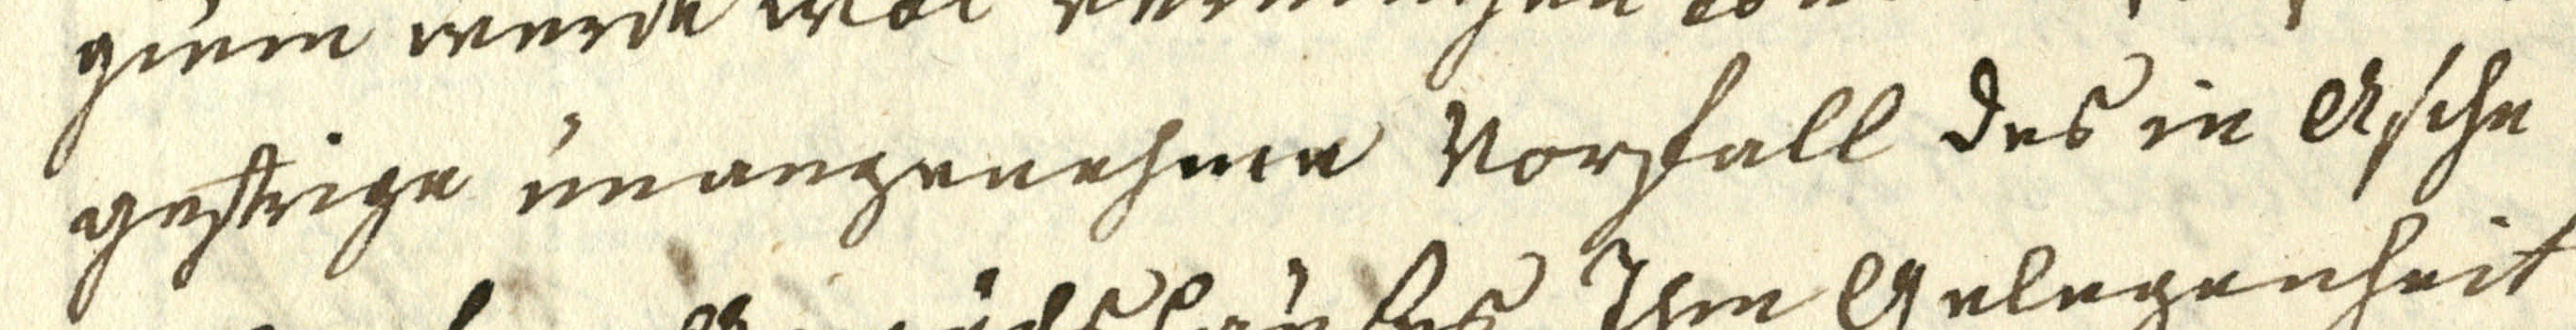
gestrige unangenehme Vorfall des in Asche
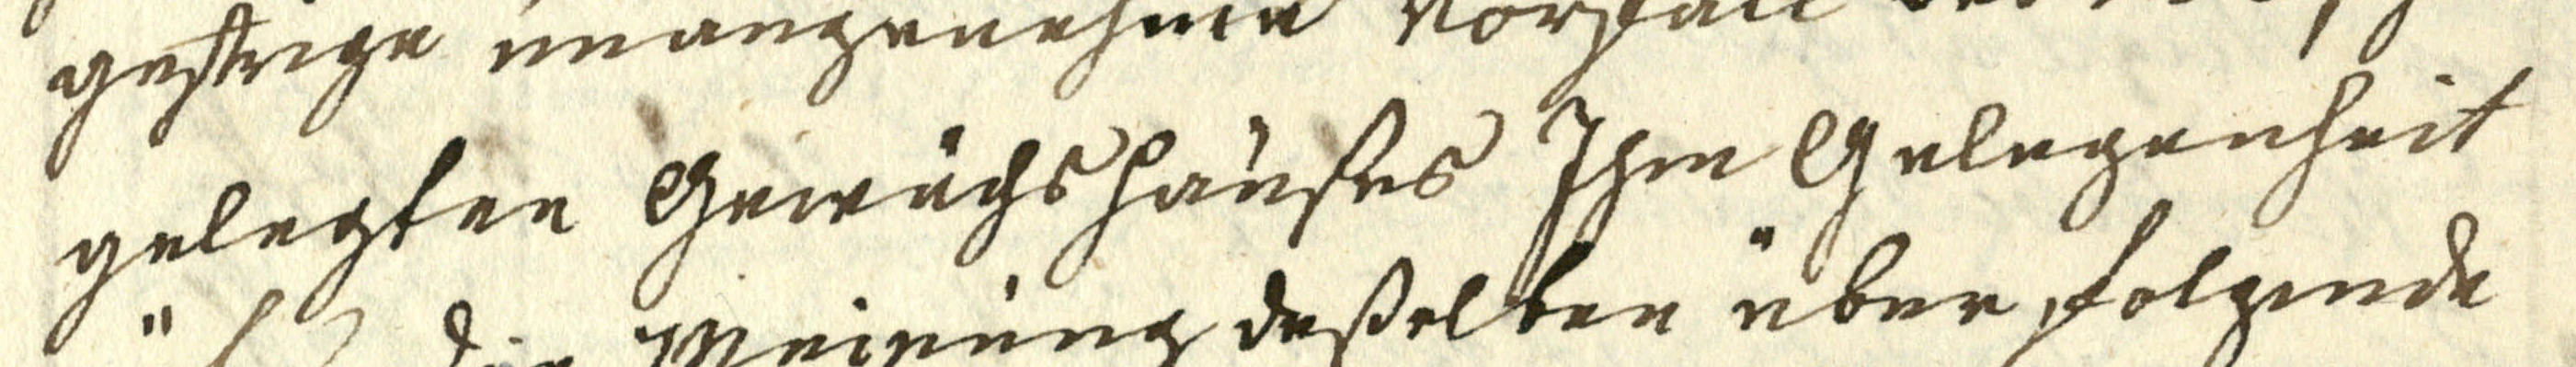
gelegten Gewächshaußes Ihm Gelegenheit
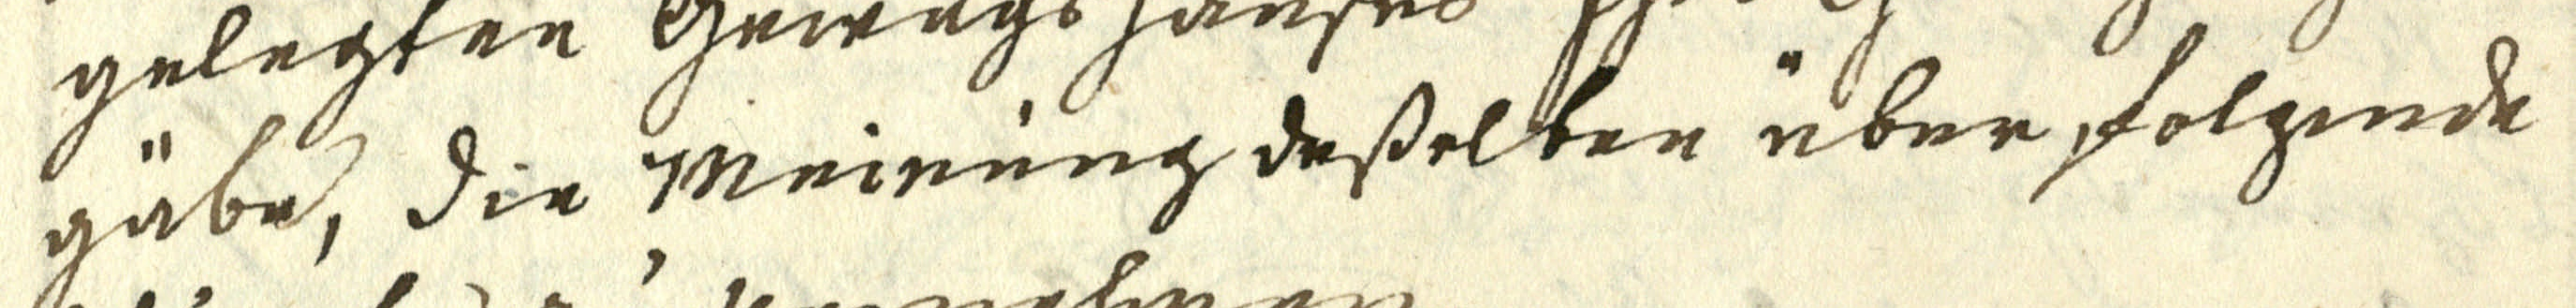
gäbe, die Meinung deßelben über folgende
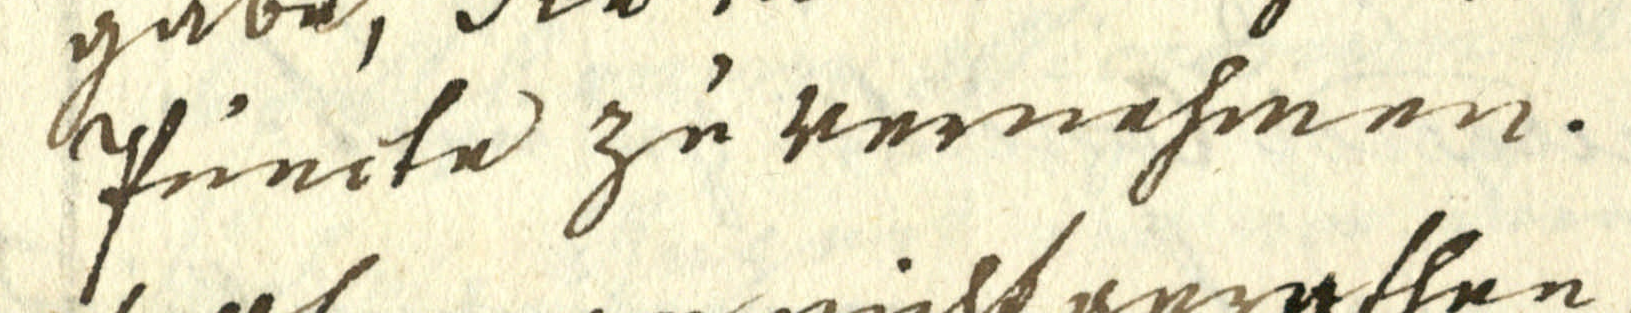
Puncte zu vernehmen.
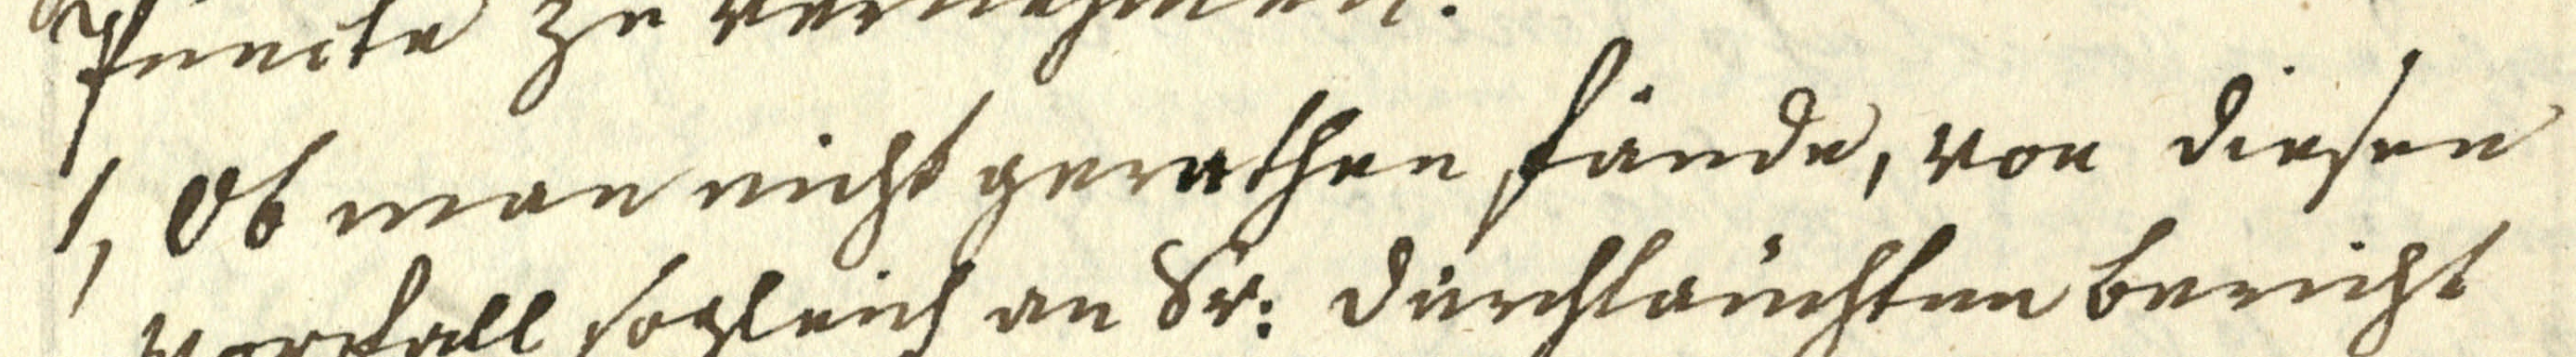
1, Ob man nicht gerathen fände, von diesen
